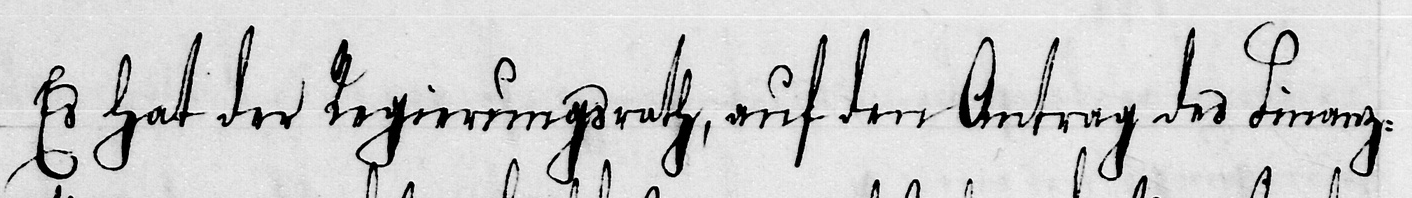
Es hat der Regierungsrath, auf den Antrag des Finanz¬
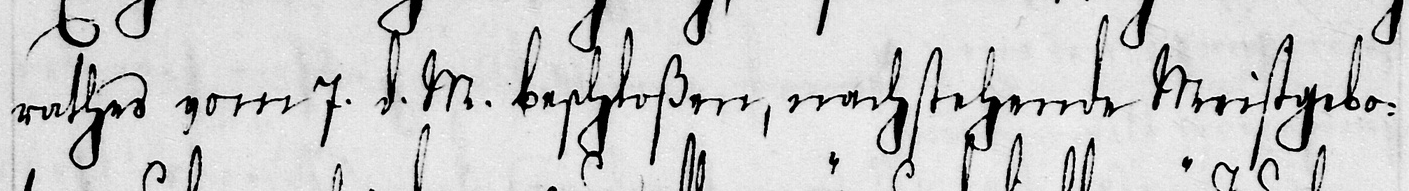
rathes vom 7. d. M. beschloßen, nachstehende Meistgebo¬
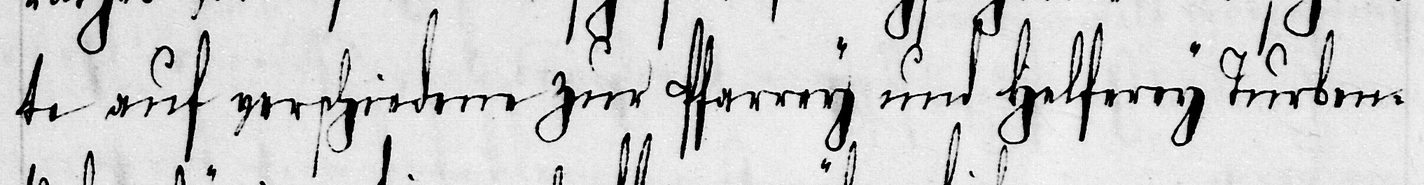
te auf verschiedene zur Pfarrey und Helferey Turben¬
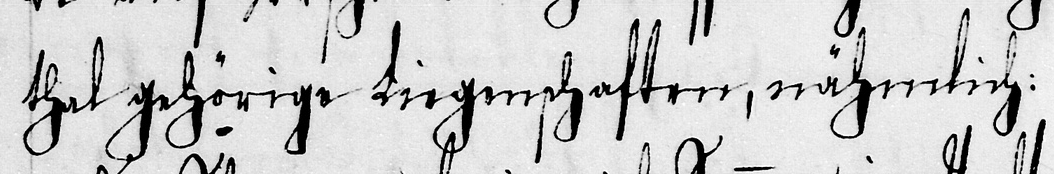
thal gehörige Liegenschaften, nämlich:
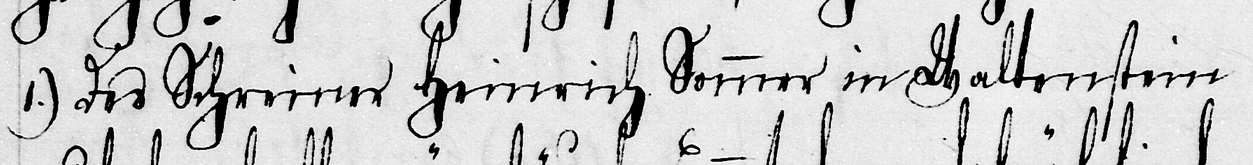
1.) Des Schreiner Heinrich Sommer in Waltenstein
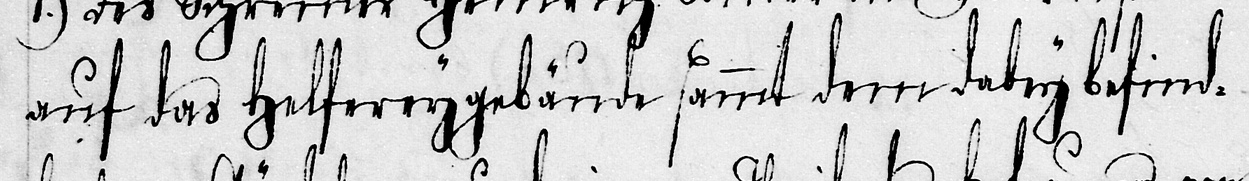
auf das Helfereygebäude sammt dem dabey befind¬
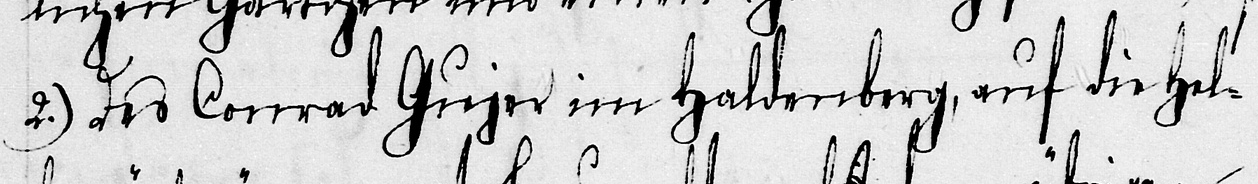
2.) Des Conrad Gujer im Haldenberg, auf die Hel¬
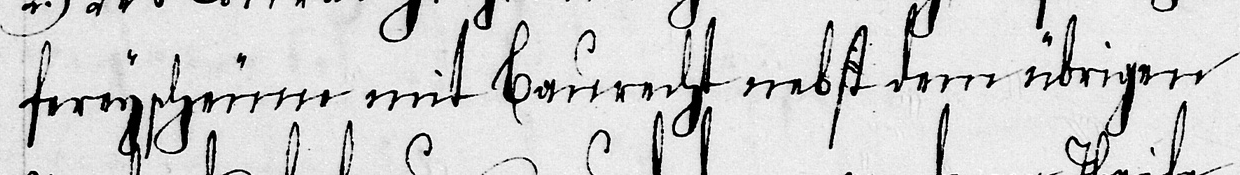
fereyscheune mit Baurecht nebst dem übrigen
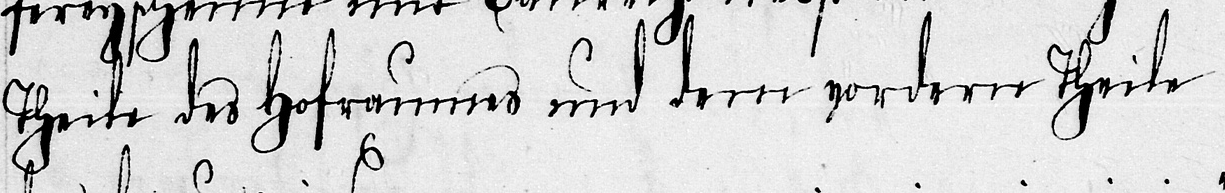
Theile des Hofraumes und dem vordern Theile
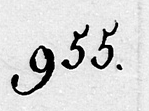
955.
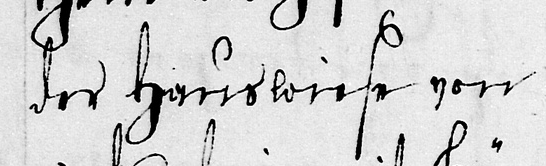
der Hauswiese von
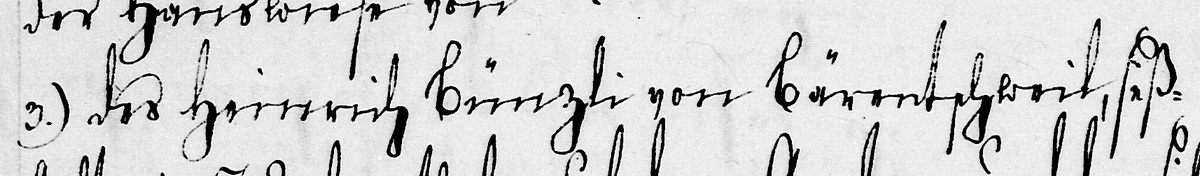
3.) des Heinrich Bünzli von Bärentschweil, seß¬
